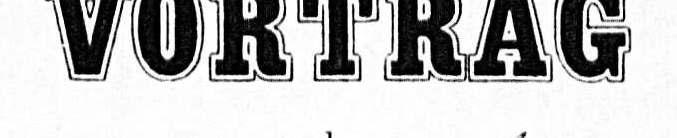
VORTRAG
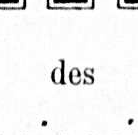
des
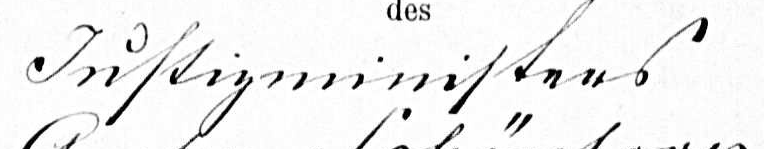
Justizministers
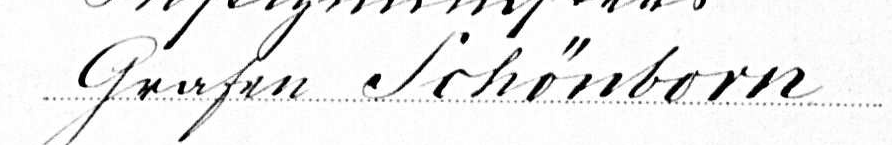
Grafen Schönborn
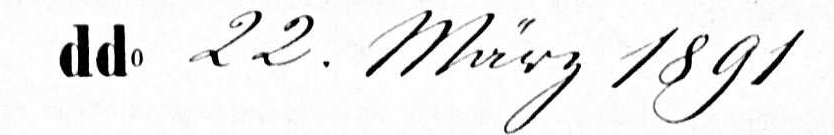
Ddo 22. März 1891
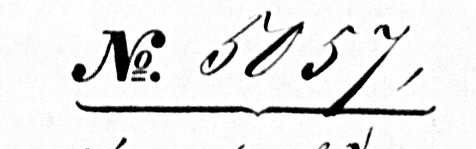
No 5057,
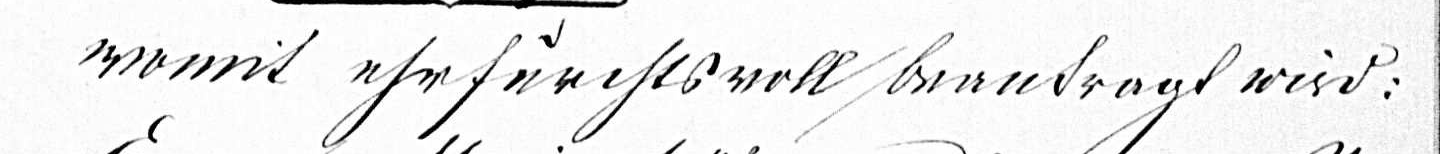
Womit ehrfürchtsvoll beantragt wird:
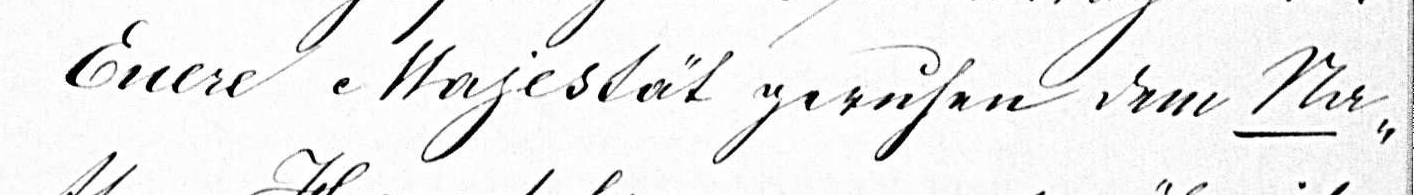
Euere Majestät geruhen dem Na¬
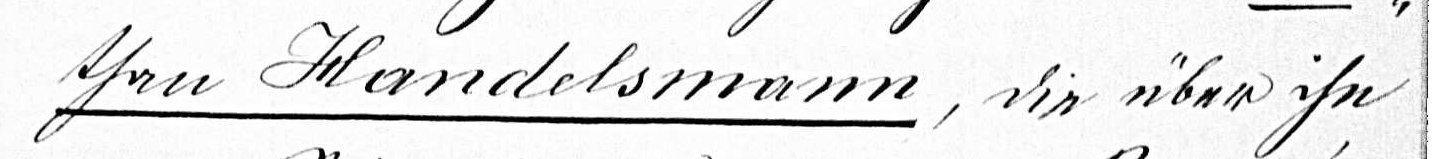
than Handelsmann, die über ihn
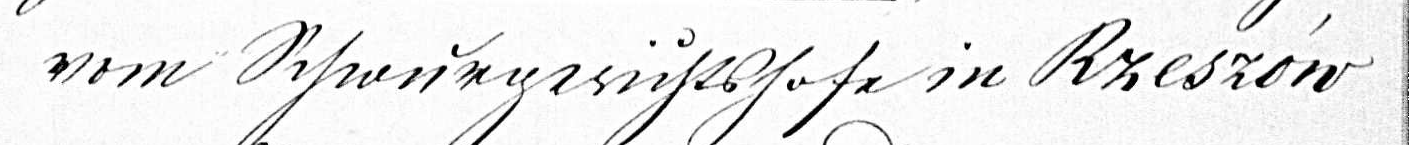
vom Schwurgerichtshofes in Rzeszów
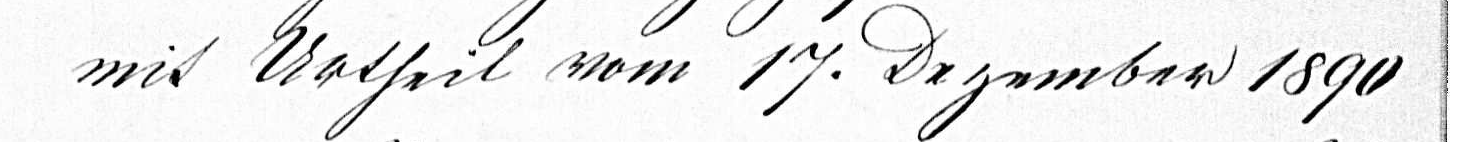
mit Urtheil vom 17. Dezember 1890
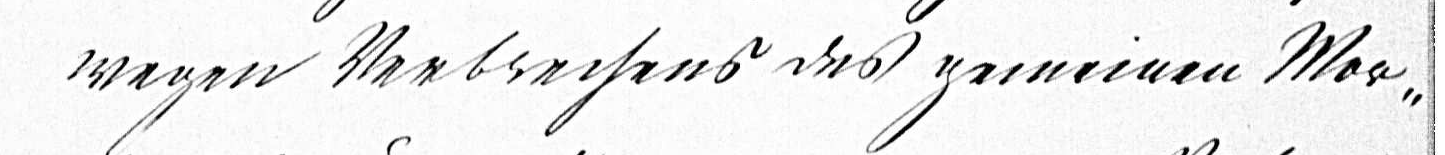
wegen Verbrechens des gemeinen Mor¬
